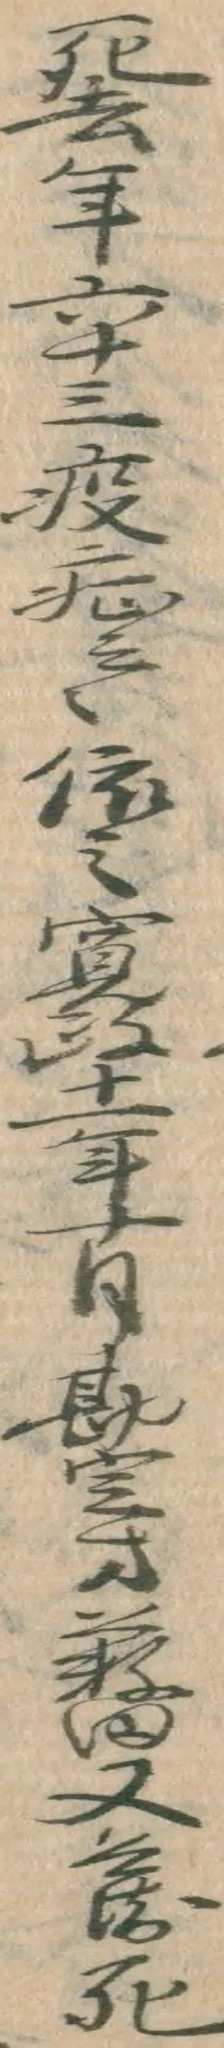死去年六十三疫症云々依之寛政十一年十月勘定方藤田又兵衛死
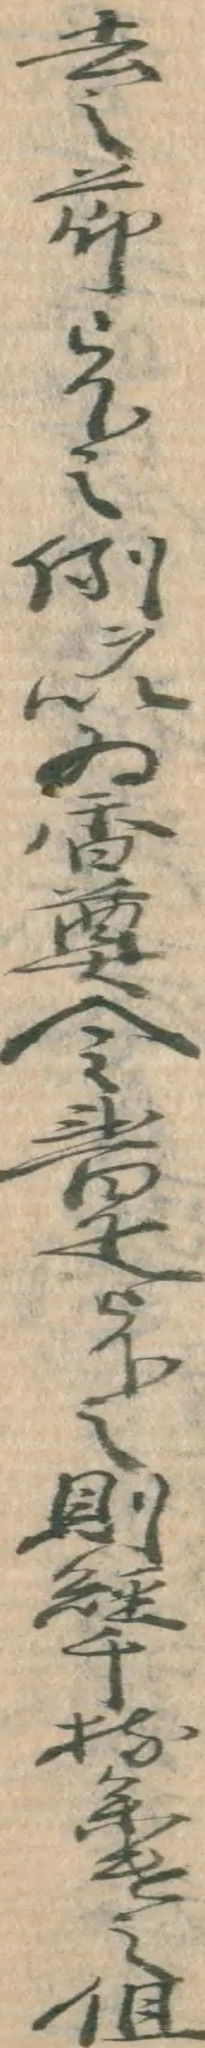去之節已下之例ヲ以為香奠令弐百疋被下之則経千持参遣之但
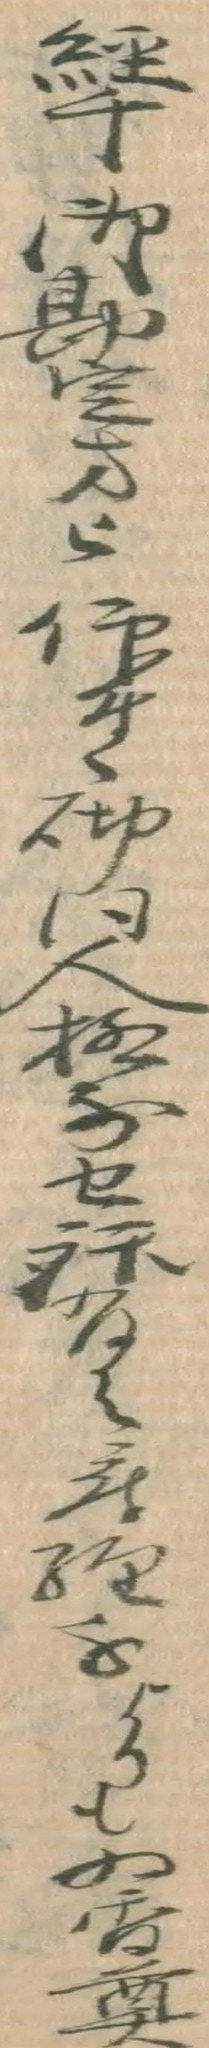経千御勘定方被仰付候砌同人格別世話有之ニ付経千よりも為香奠

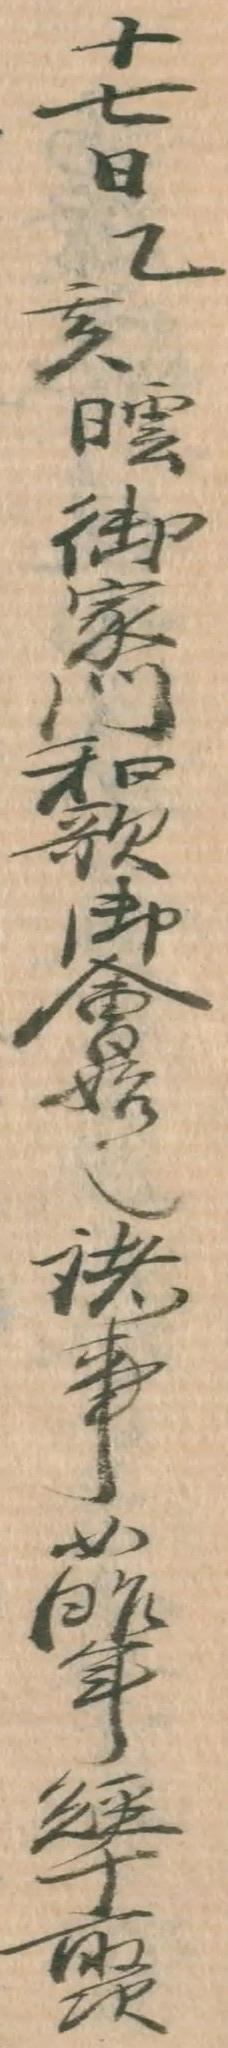十七日乙亥曇御家門和歌御會始之諸事如昨年経千取次
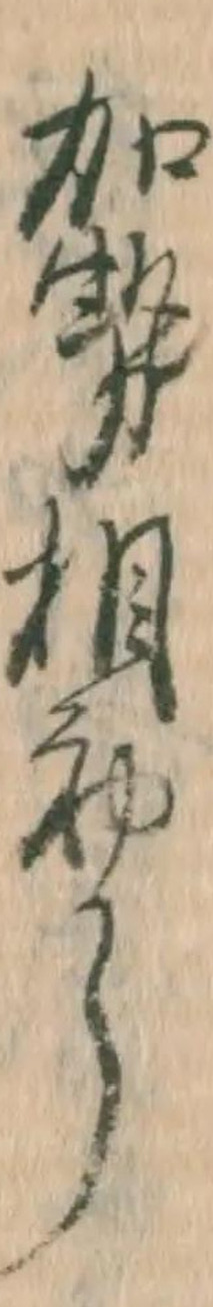加勢相勤了
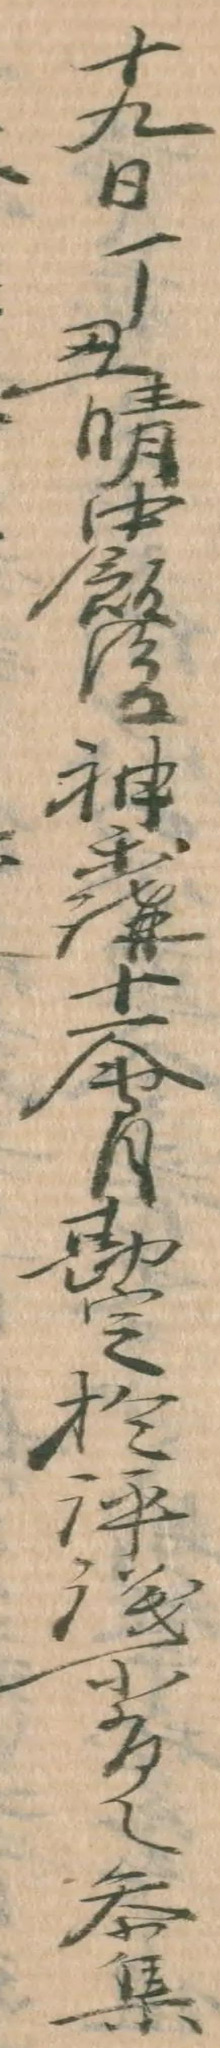十九日丁丑晴中飯後神楽講十一會目勘定於評議所有之参集
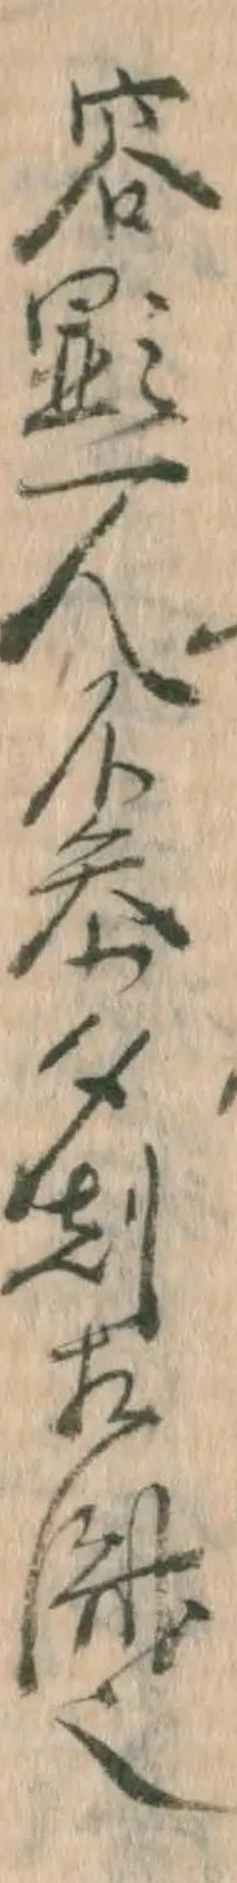容顕一人不参夕刻相済也
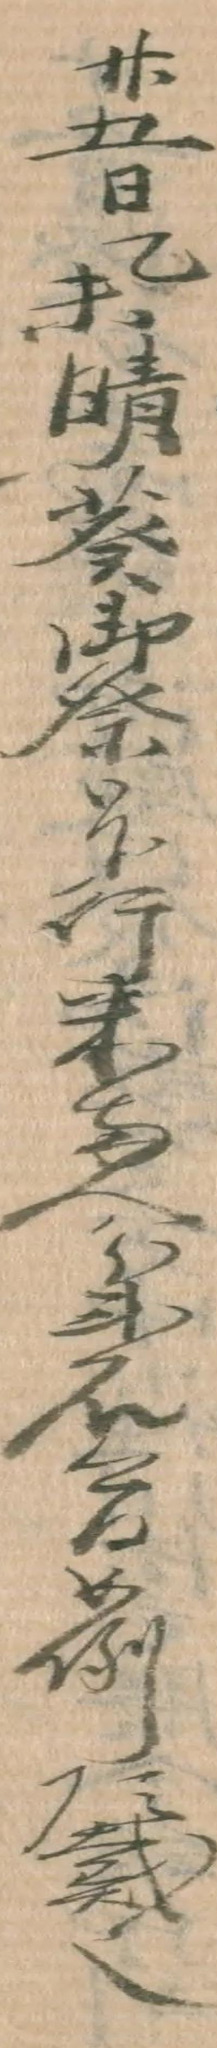廿五日乙未晴葵御祭御下行米両人分弐石今日如例頂戴也
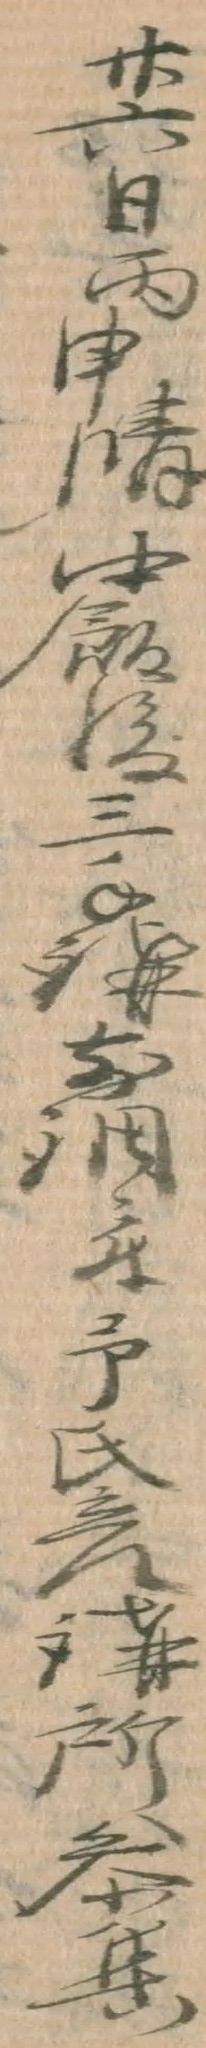廿六日丙申晴中飯後三手講前調ニ付予氏彦講所へ参集
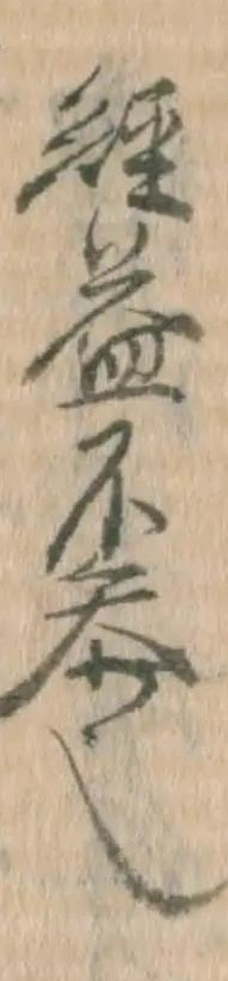経益不参也
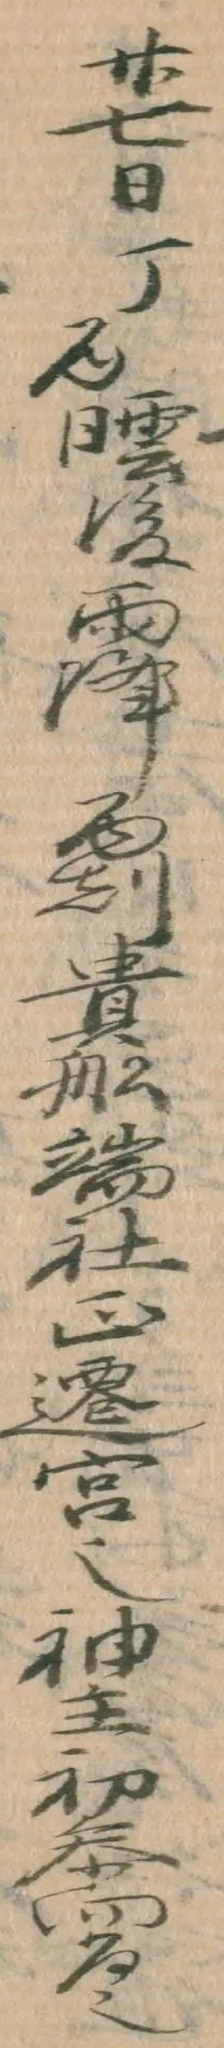廿七日丁酉曇後雨降酉刻貴舩端社正遷宮也神主初参向有之
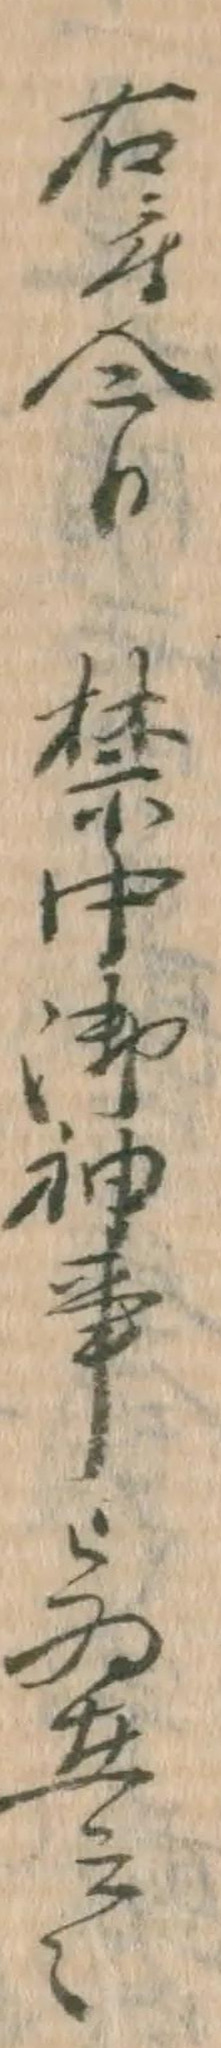右二付今日禁中御神事被為在云々
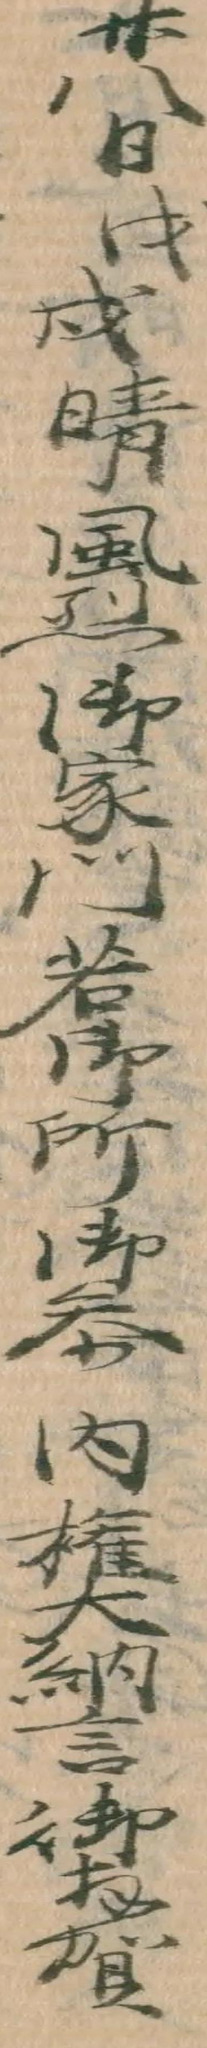廿八日戊戌晴風烈御家門若御所御参内権大納言御相賀
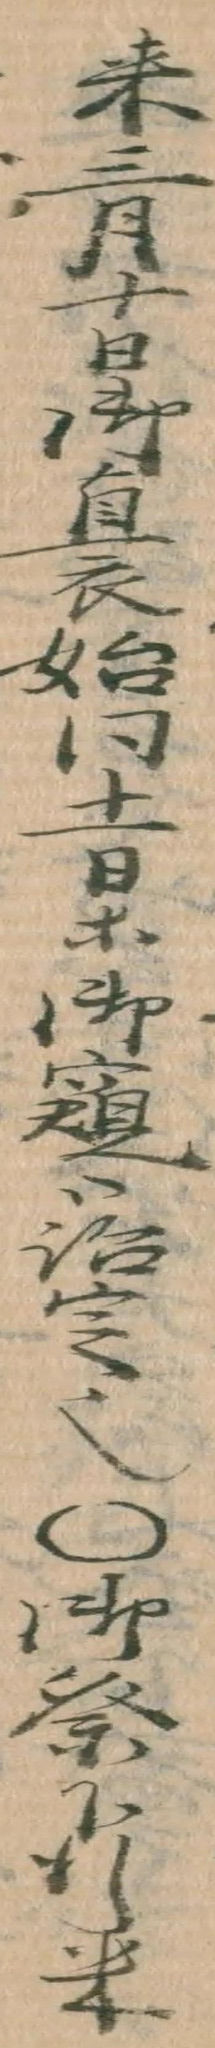来三月十日御直衣始同十一日等御窺御治定也○御祭下行米
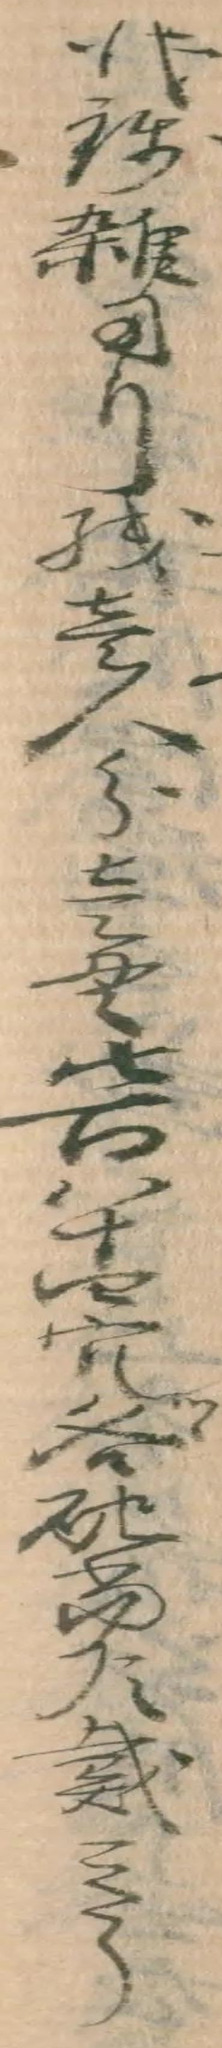代銭雑用引残壱人分壱貫七百八十四穴各配當頂戴之了
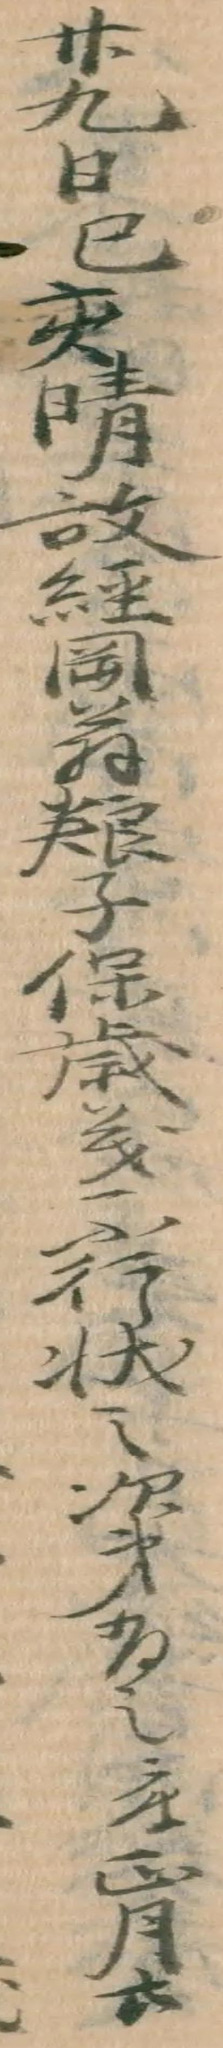廿九日巳亥晴故経岡翁養子保歳義不行状之次第有之ニ付正月廿
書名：賀茂社記録. 第65冊
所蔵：国立国会図書館 National Diet Library, JAPAN
